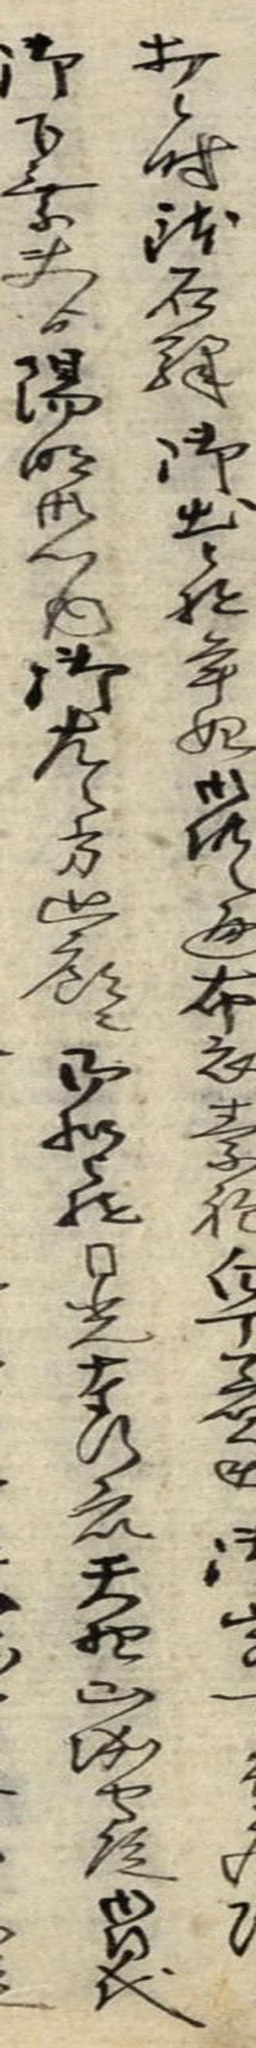御下乗夫ゟ陽明御門内御左之方廻廊に御扣被遊日光奉行衆天野山城守殿御目代
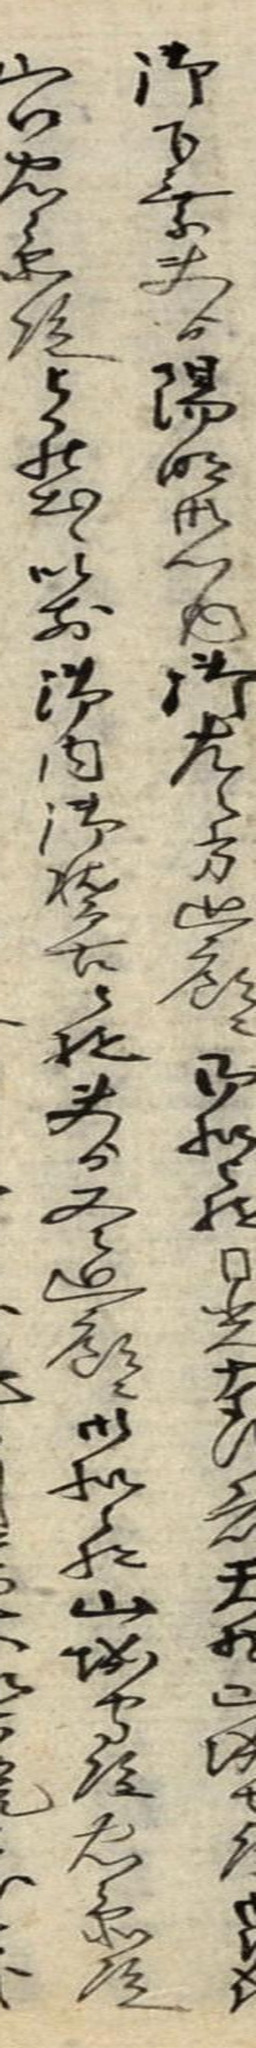山口忠兵衛殿被罷出候以前御内御稽古被遊夫ゟ又々廻廊に御扣被遊山城守殿忠兵衛殿
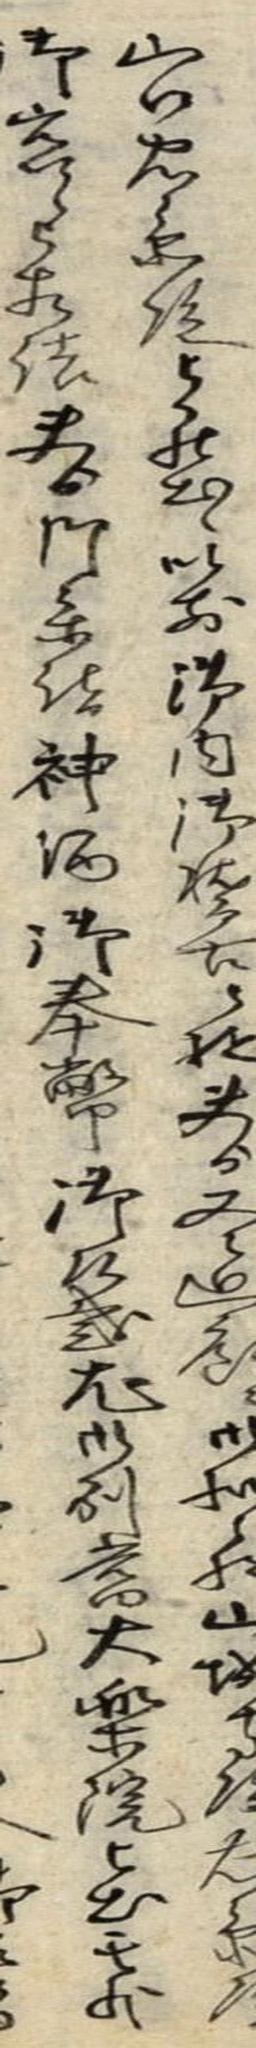御宮へ被相詰夫ゟ御参詣神酒御奉幣御頂戴尤御別当大楽院被出其外
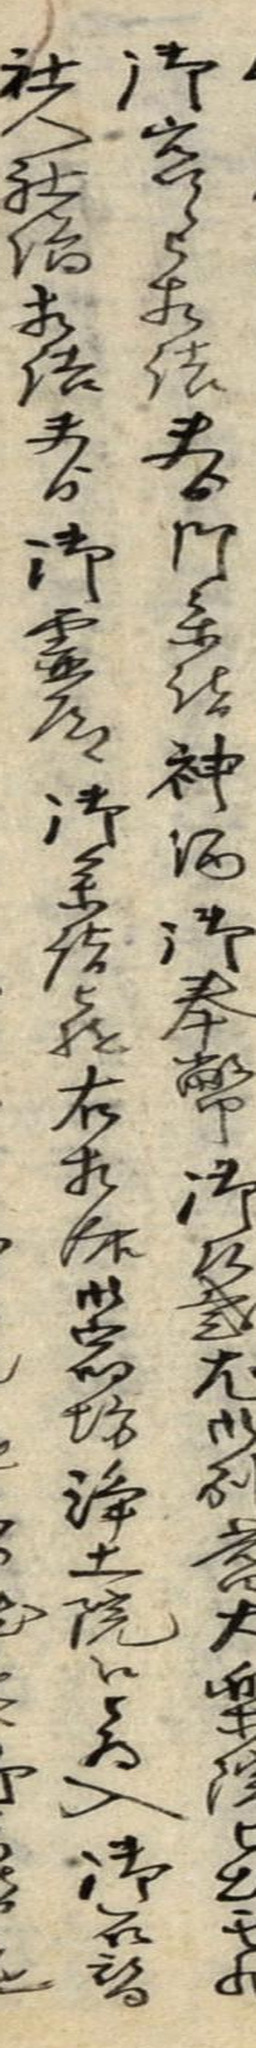社人社僧相詰夫ゟ御霊屋へ御参詣被遊右相済御宿坊浄土院江被為入御召替
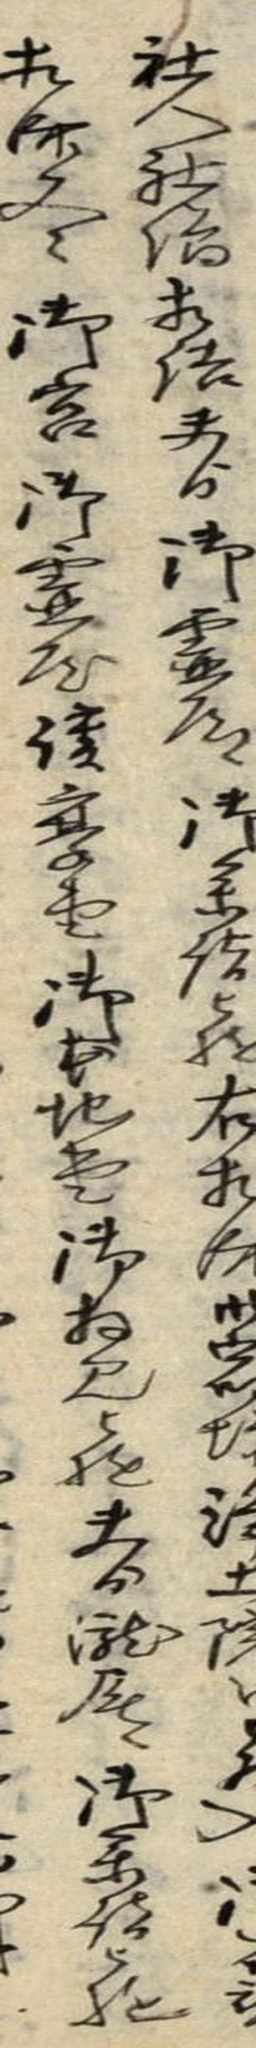相済又々御宮御霊屋護摩堂御本地堂御拝見被遊瀧尾へ御参詣被遊
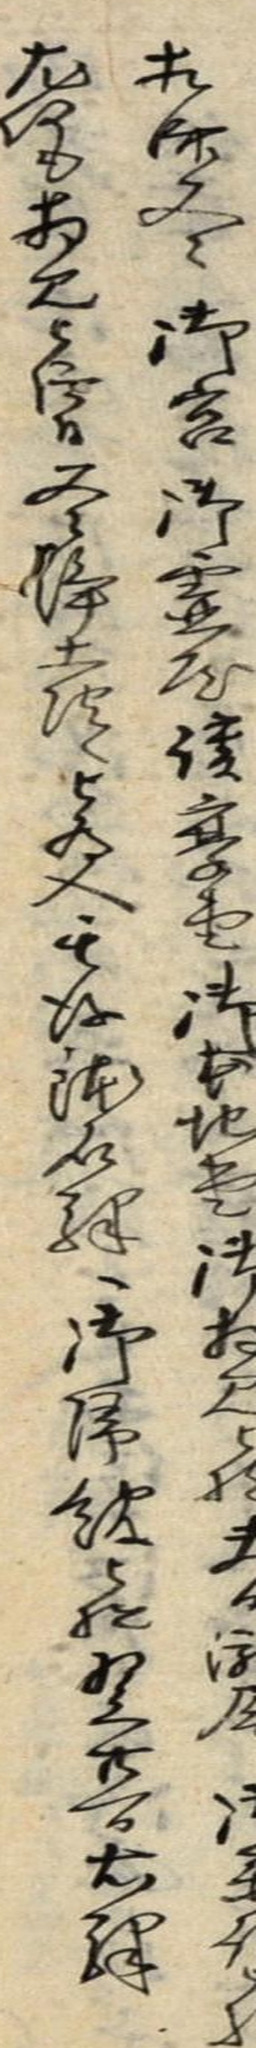尤何も拝見被仰付又々浄土院へ被為入其後鉢石駅へ御帰館被遊翌廿一日右駅

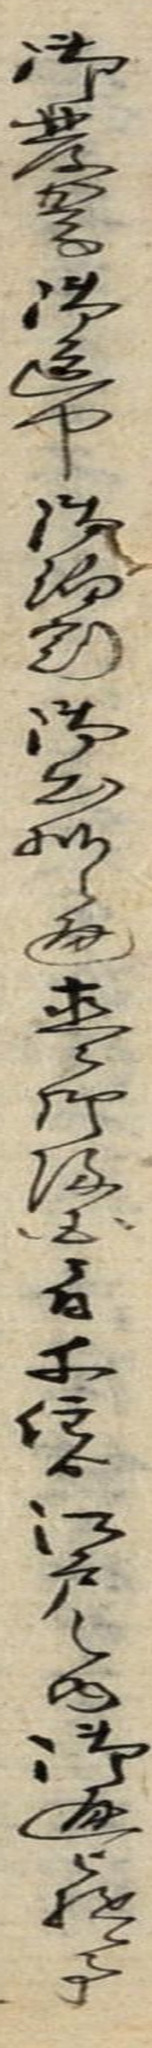御発駕御道中御泊割御出掛之通直に御帰国に付千住ゟ江戸之内御通被遊候事
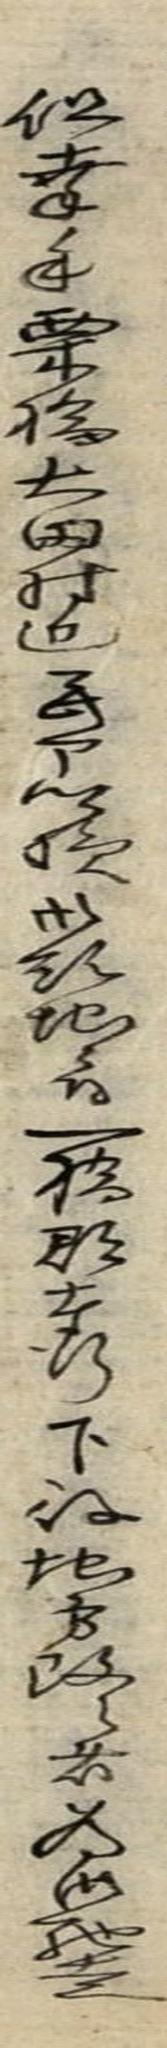但幸手栗橋大田村迄民部卿様御領地に付一橋郡奉行下役地方改之者為御馳走
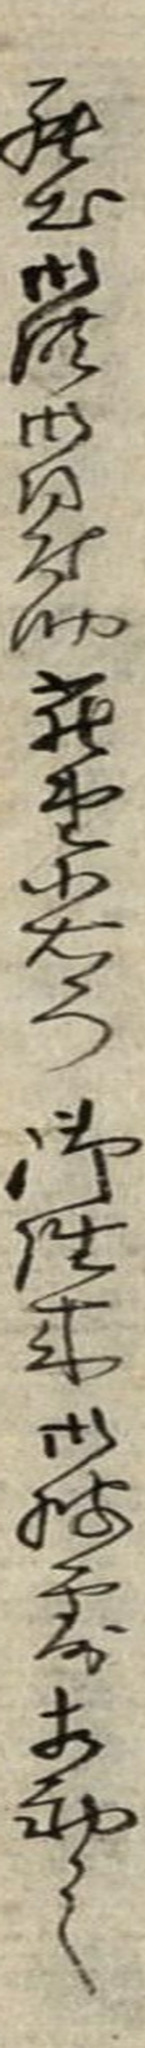罷出御供御目付助荻野小右衛門御往来御披露相勤之
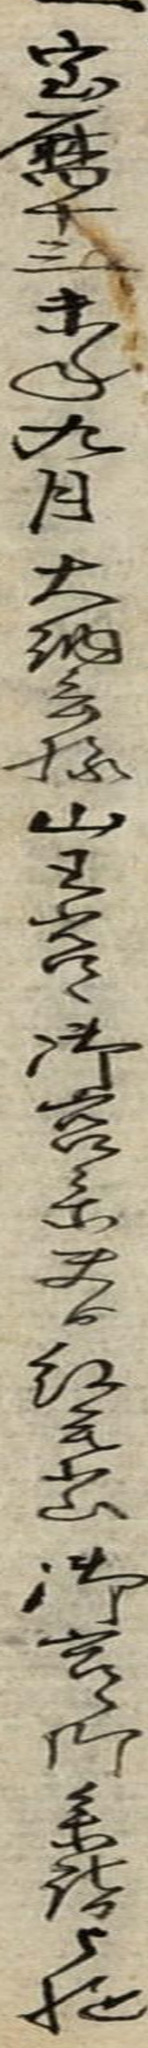一宝暦十三未年九月大納言様山王宮へ御宮参夫ゟ紅葉山御宮へ御参詣被遊
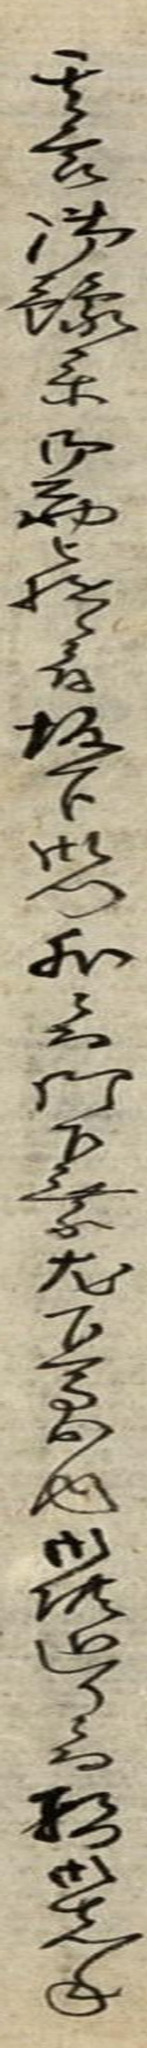其節御予参御勤被遊候に付坂下御門外にて御下乗尤下馬ゟ内御供廻りにて於御先手
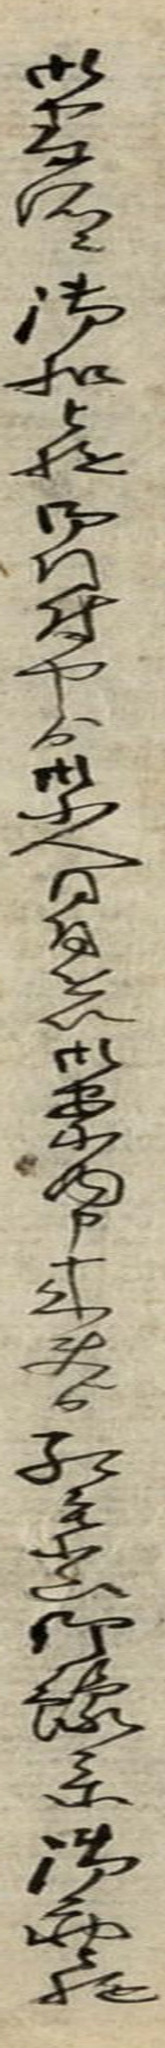御番所に御扣被遊御目付中ゟ御小人目付を以御案内申来夫ゟ紅葉山御予参御勤被遊
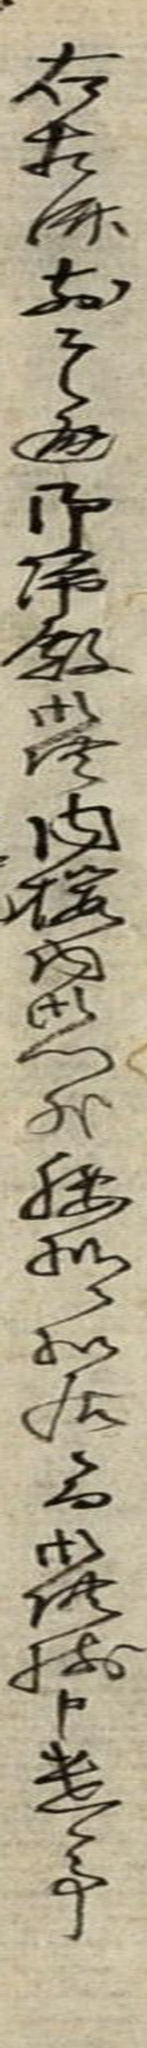右相済前々之通御帰殿御供内桜内御門外腰掛へ扣居候て御供揃申遣候事
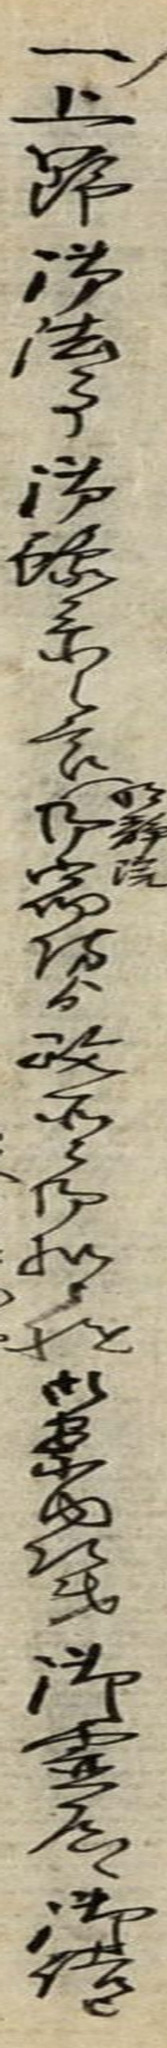一上野御法事御予参之節明静院御宿坊ゟ改所に御扣被遊御案内次第御霊屋へ御詰被
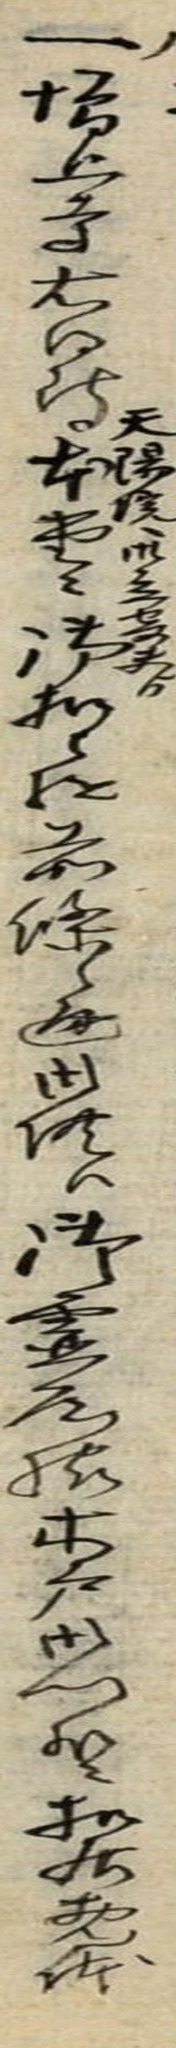一増上寺右同断天陽院へ御立寄夫ゟ本堂に御扣被遊前條之通御供は御霊屋脇木戸御門外に扣居惣体
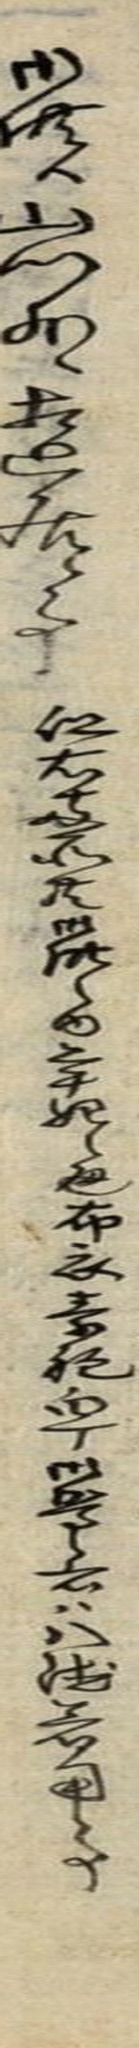御供は山門外へ相廻居候事但右両所共御供之内年始之通布衣素袍白丁御鷹之者は八徳着用之事
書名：三都并道中之部
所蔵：福井県文書館 Fukui Prefectural Archives
